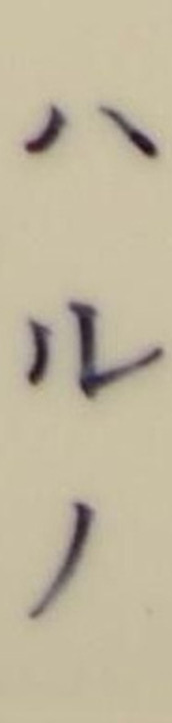ハルノ
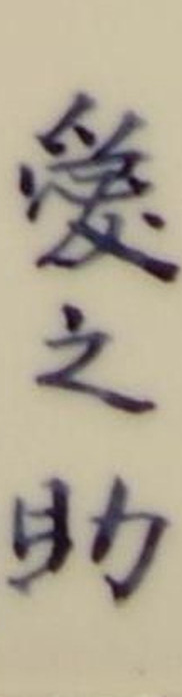愛之助
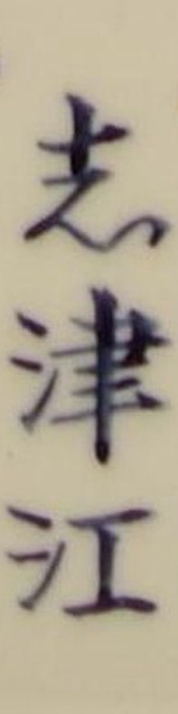志津江
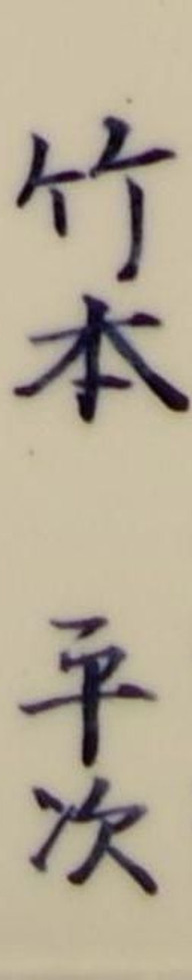竹本平次
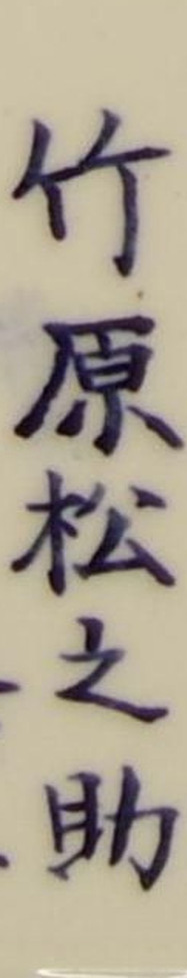竹原松之助
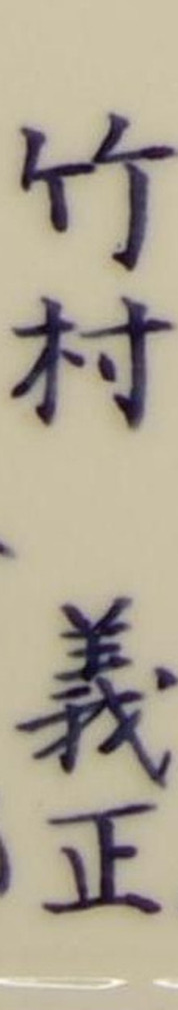竹村義正
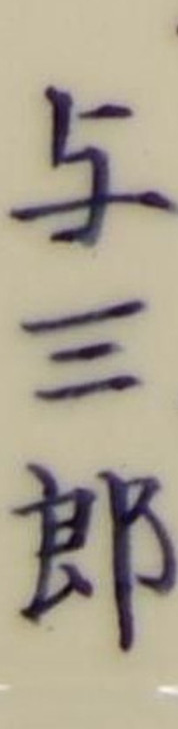与三郎
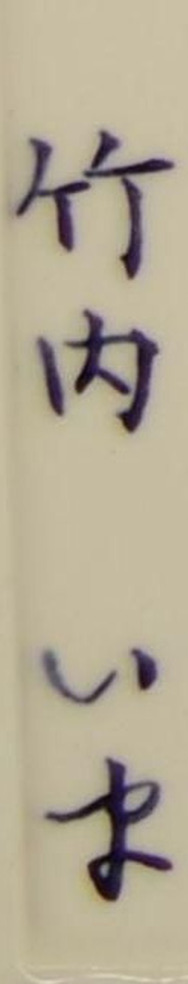竹内いま

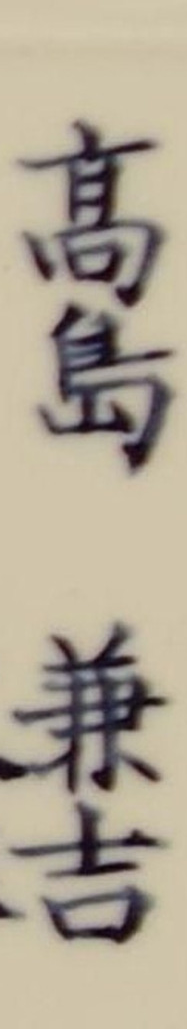高島兼吉
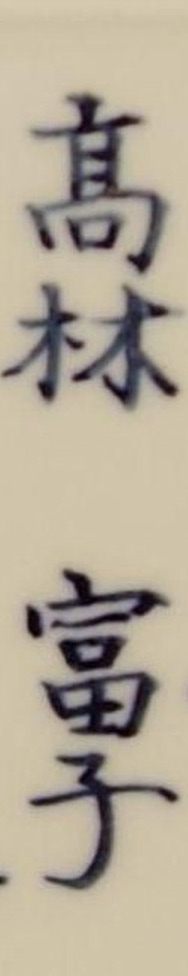高林富子
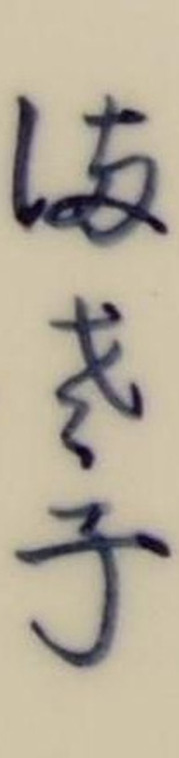まさ子
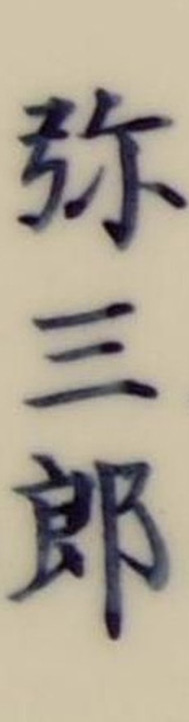弥三郎
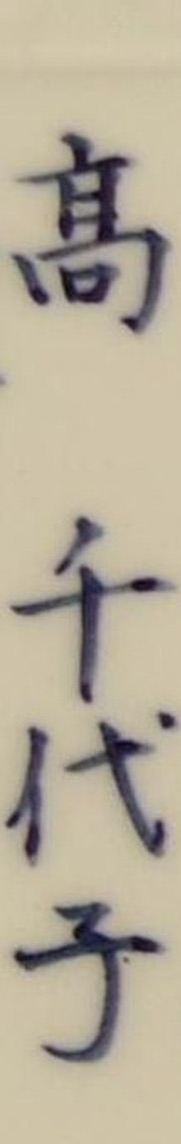高千代子
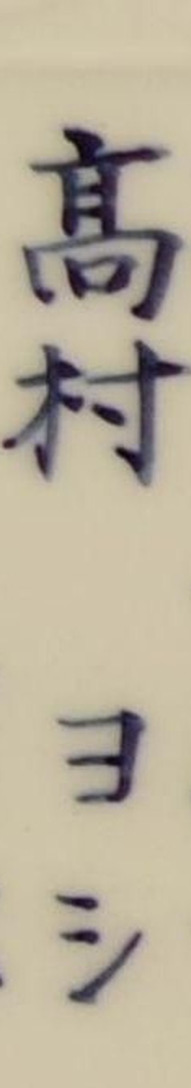高村ヨシ
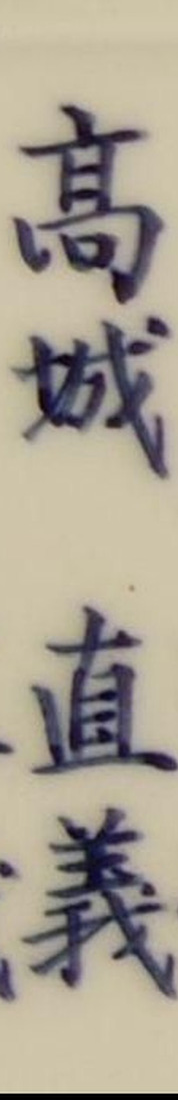高城直義

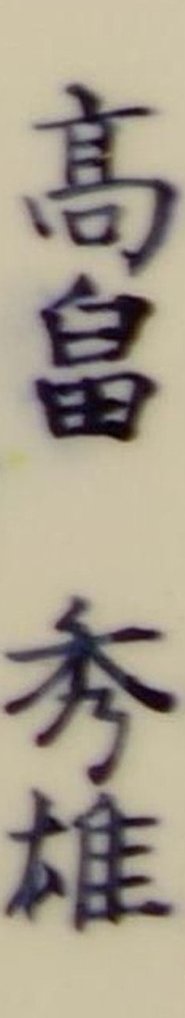高畠秀雄
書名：E~L
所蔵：高野山金剛峯寺
